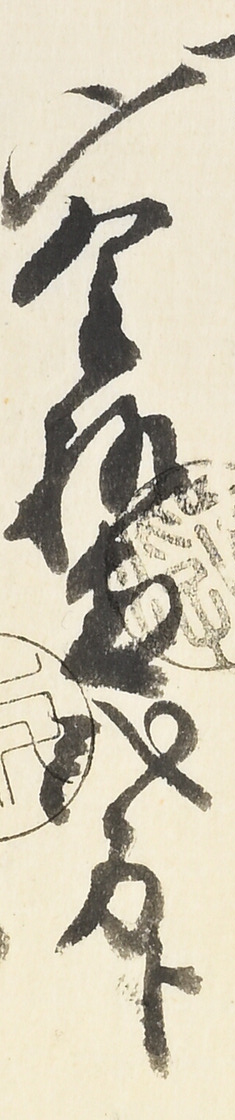〆金拾両弐分ト
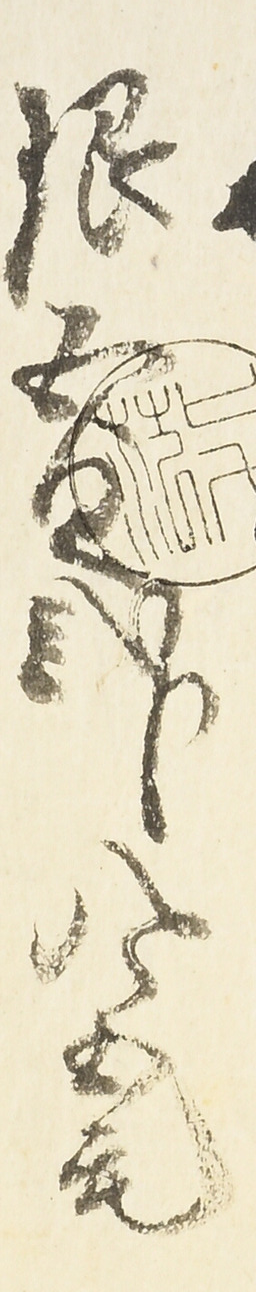銀五匁弐分八厘五毛
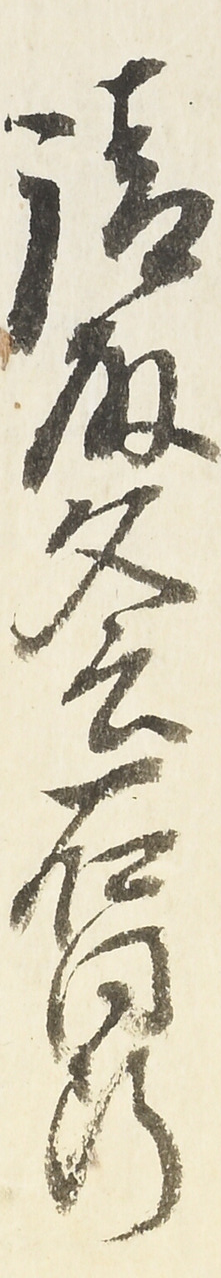請取文言右同断
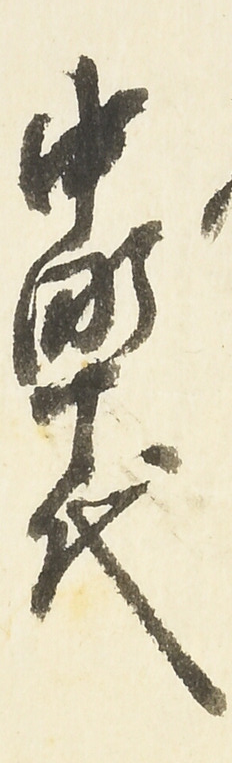中町丁代
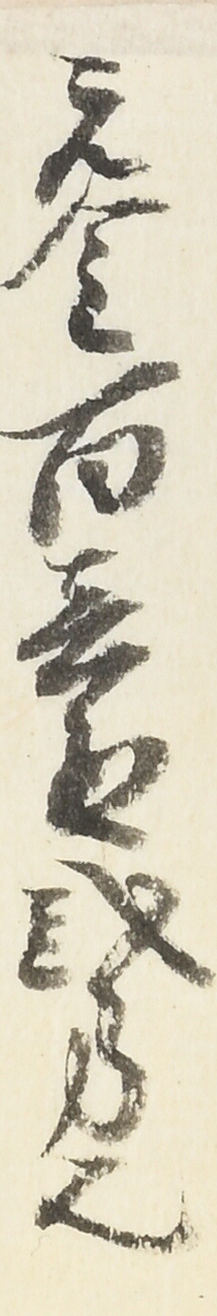元金百壱両弐分也
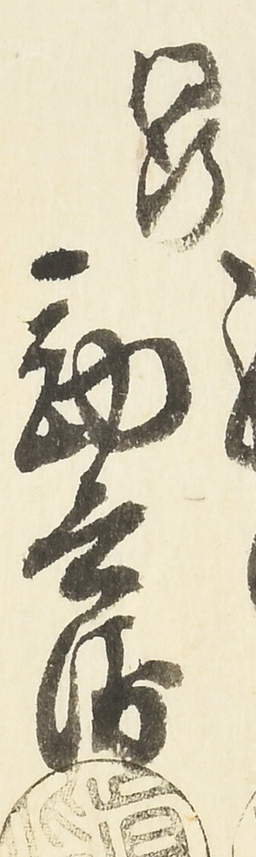勘兵衛
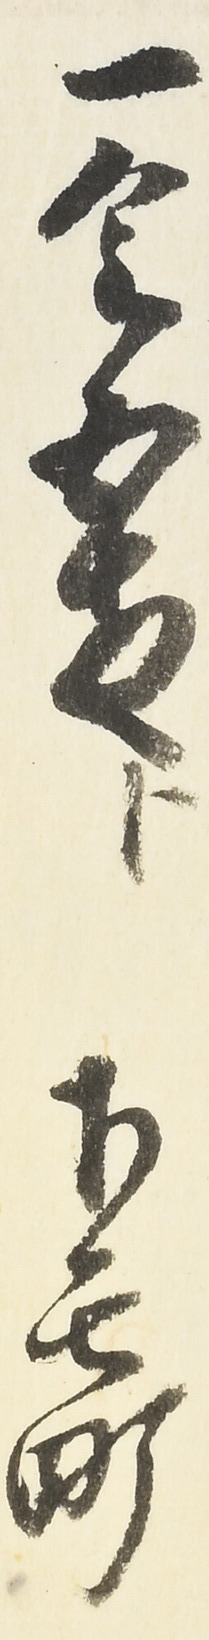一金五両ト下モ町

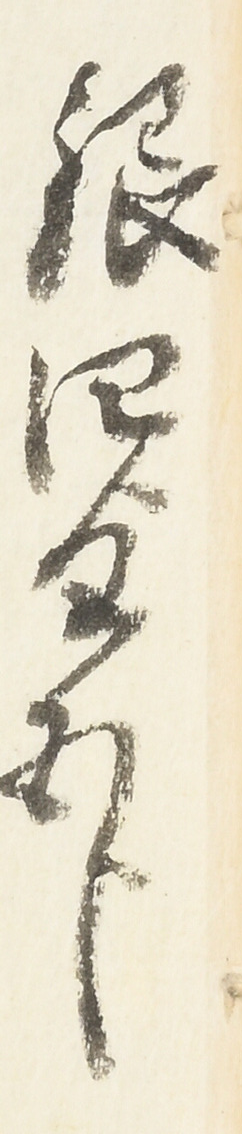銀四匁五分
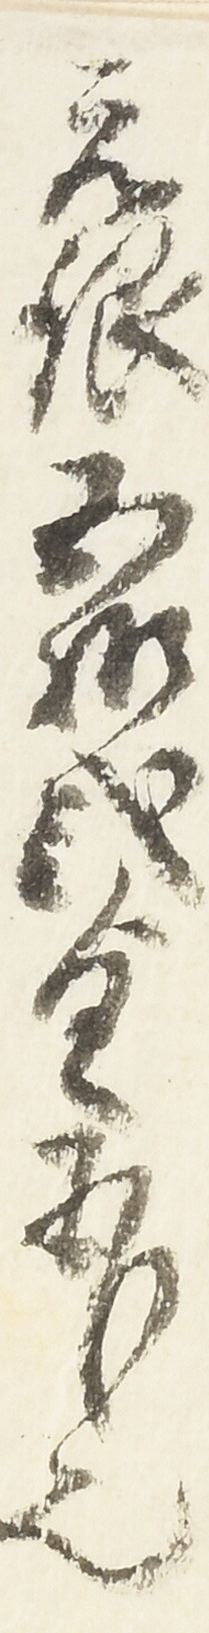元銀五拾弐匁五分也
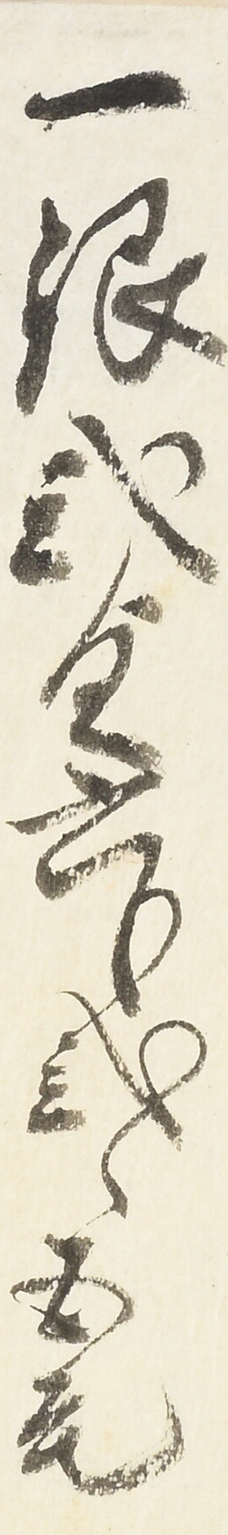一銀弐匁六分弐厘五毛
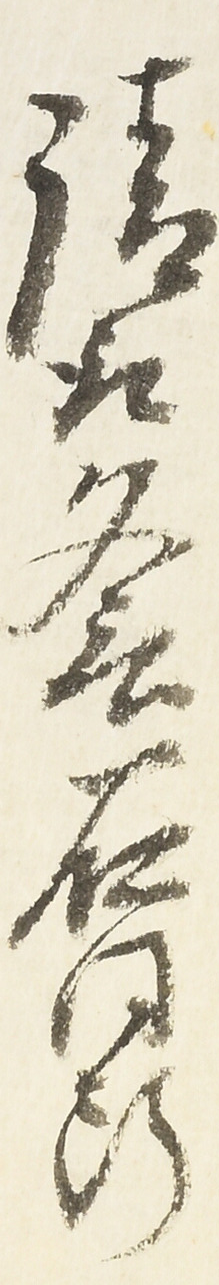請取文言右同断
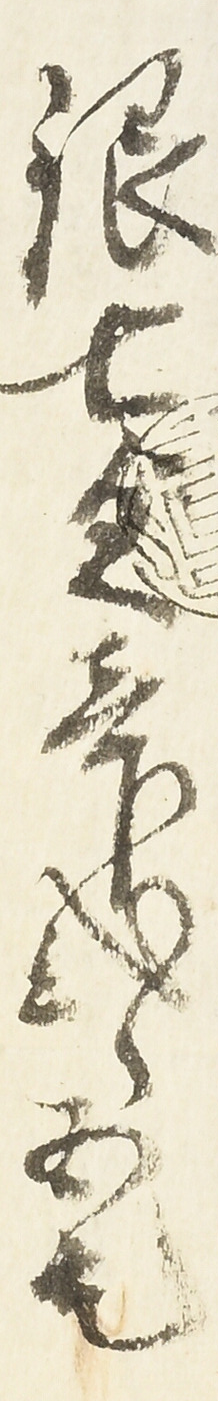銀七匁壱分弐厘五毛
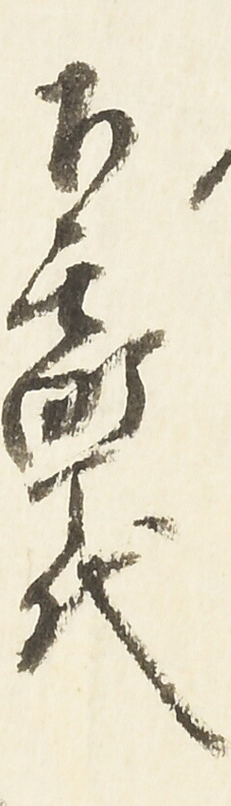下モ町丁代
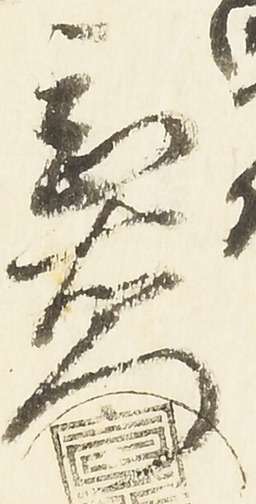辰勘右衛門
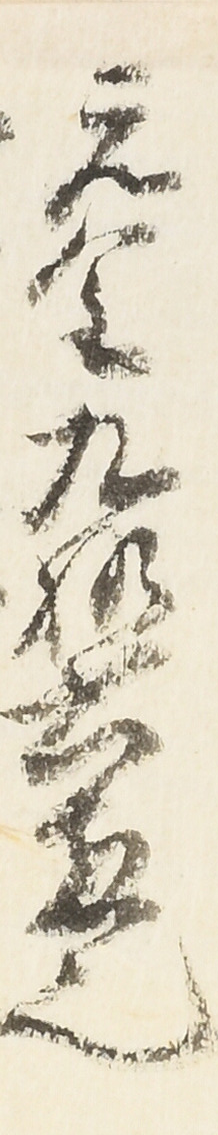元金九拾六両也
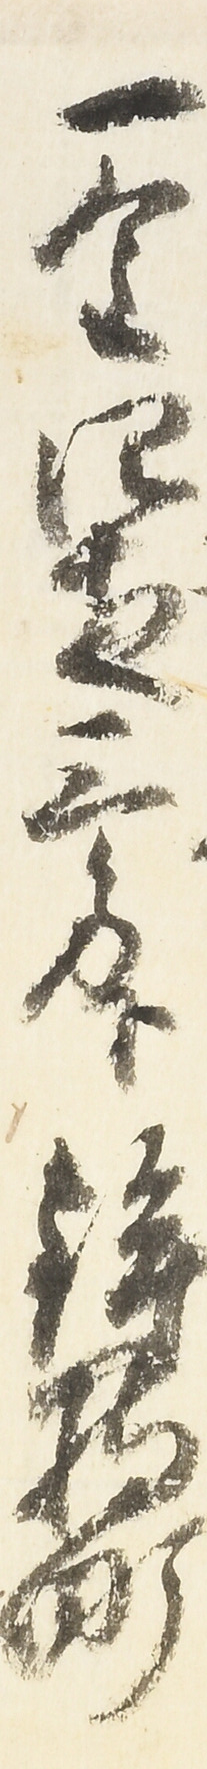一金四両三分ト鉾持町
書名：御才覚金御利足割渡扣帳
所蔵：伊那市立高遠町図書館・合同会社AMANE
